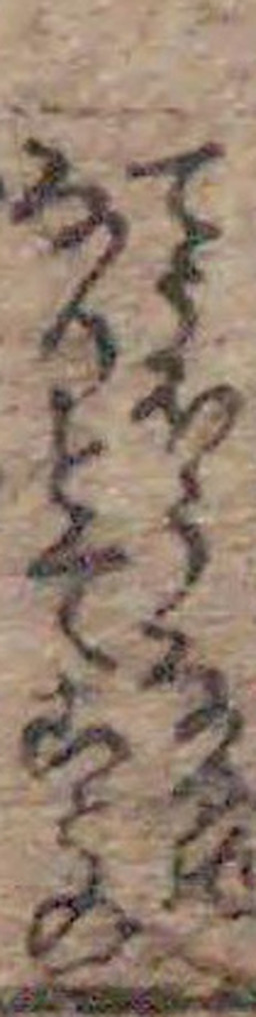なりとてことの
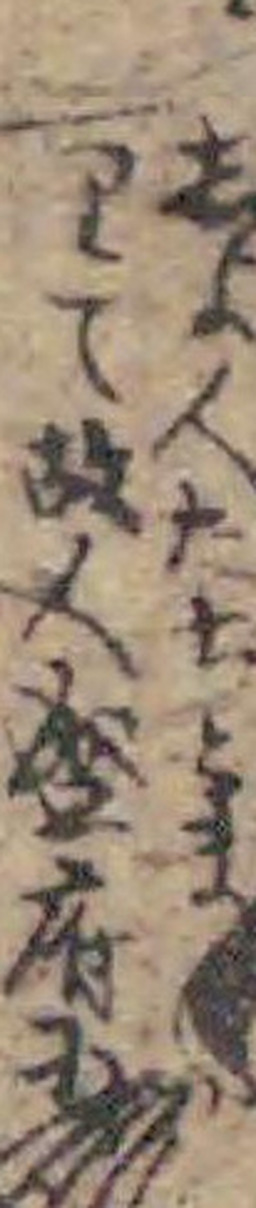りて故人盛府に
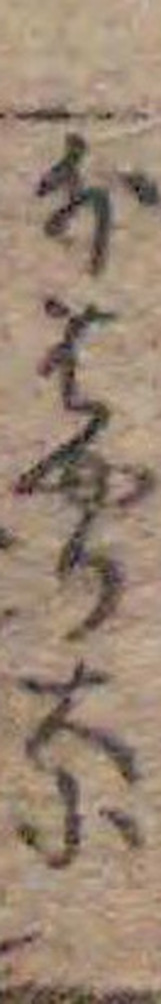外はやり大小
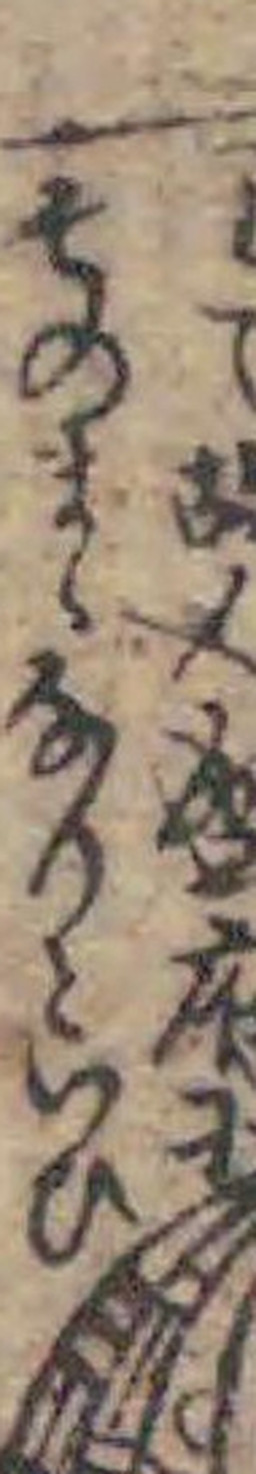そのまゝなりといひ
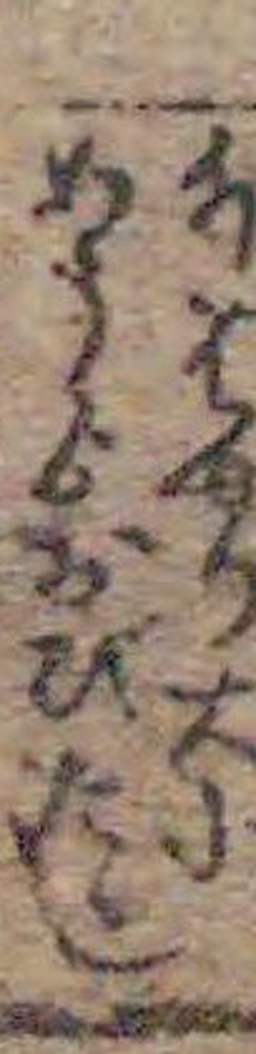めうよりおびたゝし
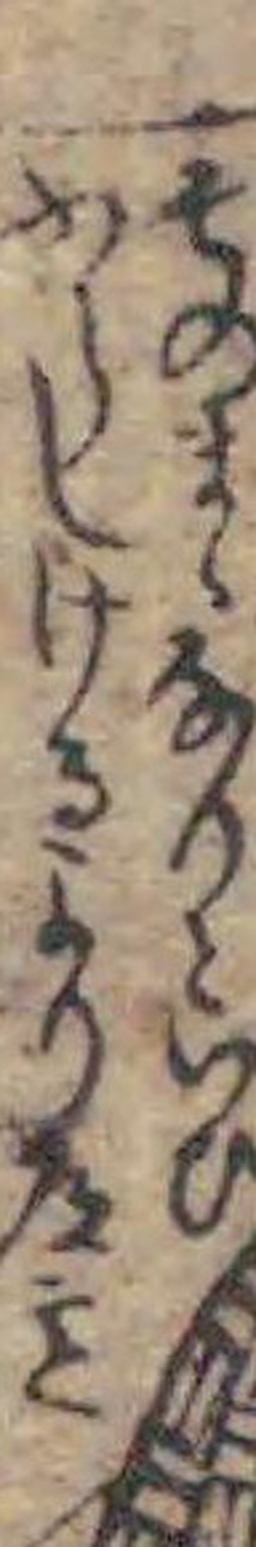ふらしけるより道意
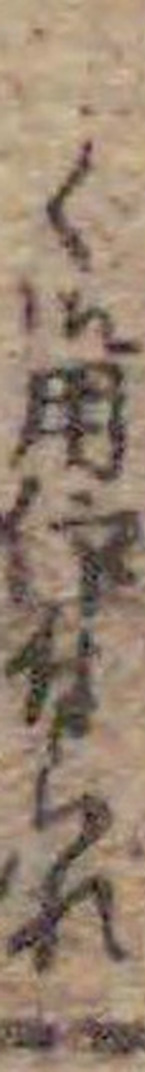く御用仰付られ
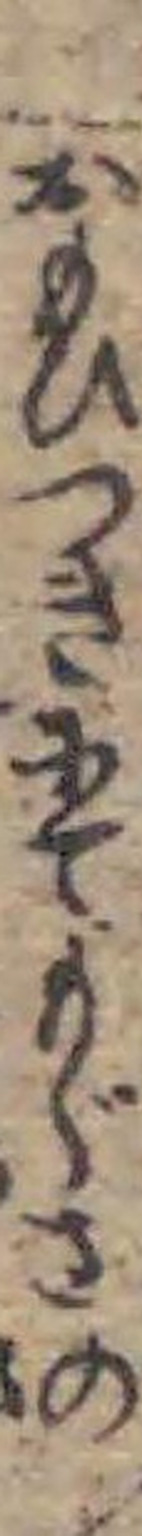おもひつきにてもぐさの
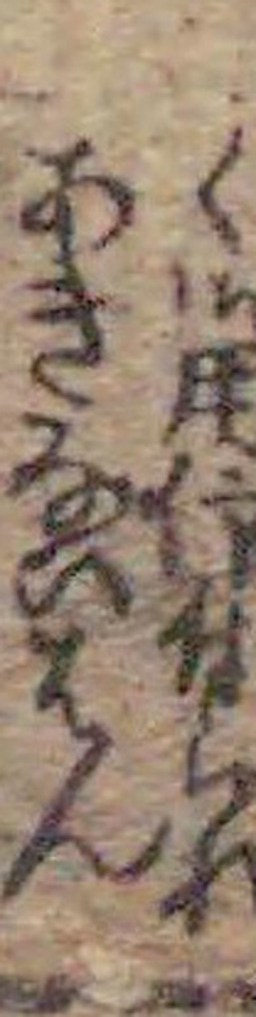あきないはん
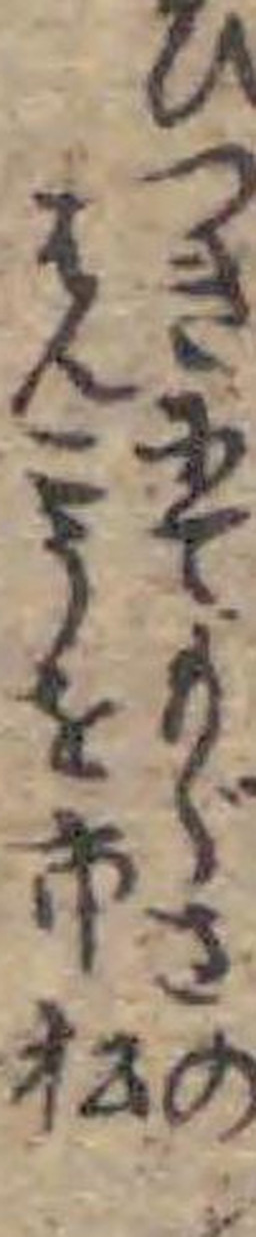はんこうを市松
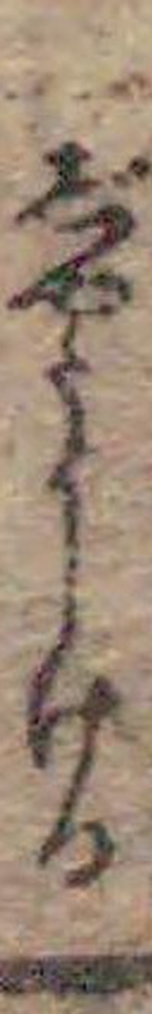じやうしける
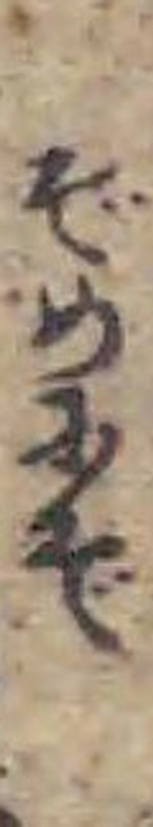ぞめにぞ
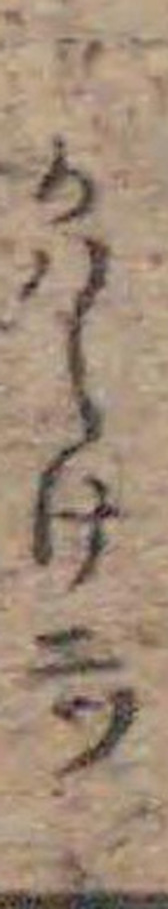かはらけ二つ
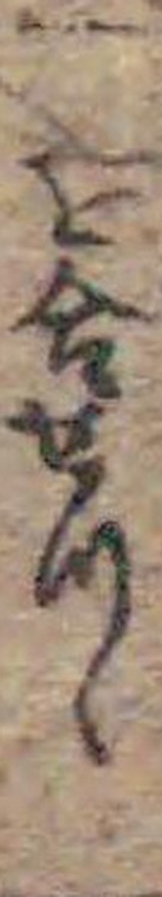を合せつゝ
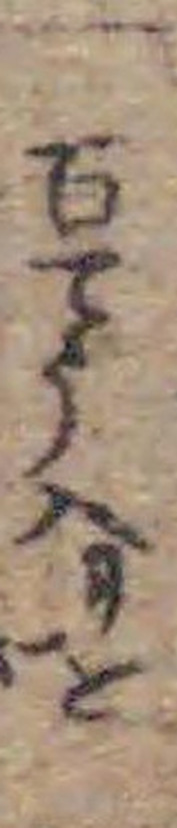百てう入りを
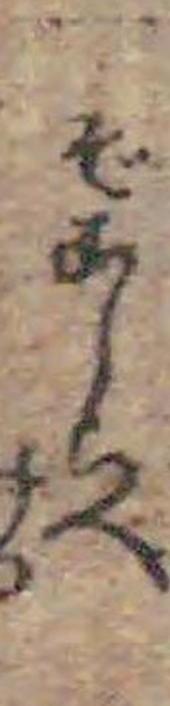ぞこしらへ
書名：三舛増鱗組 : 3巻
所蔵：国立国会図書館 National Diet Library, JAPAN
